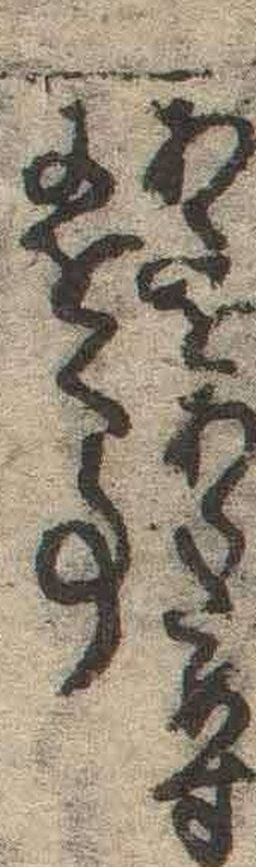にをく事
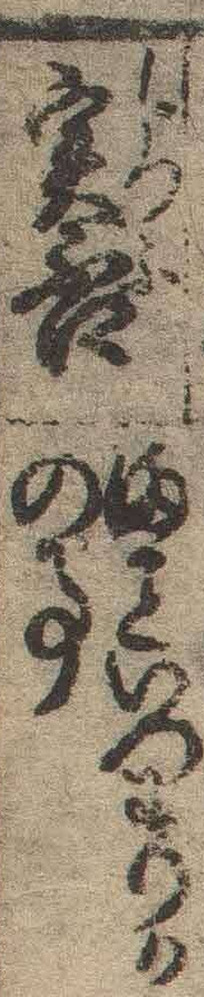実否まこといつわりか
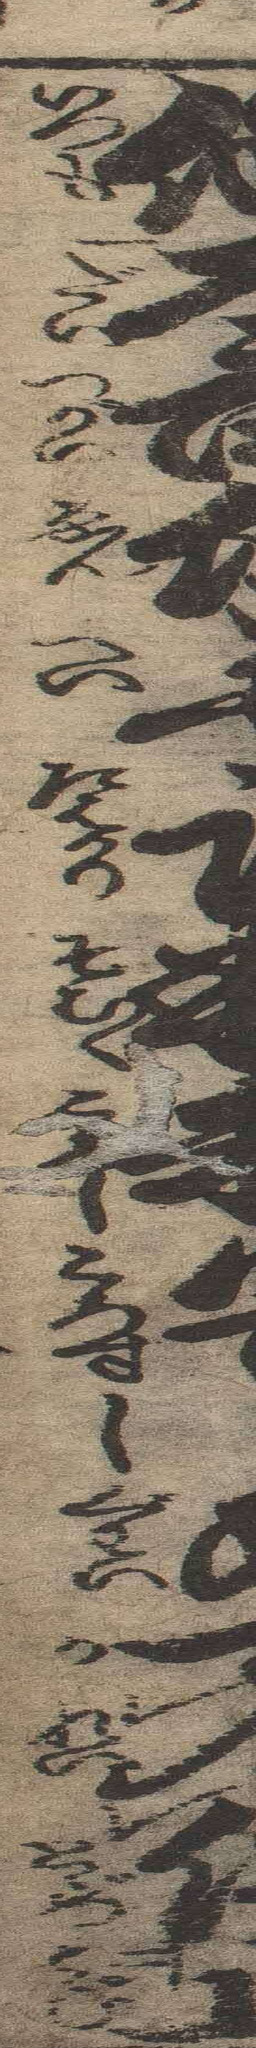いつもだいつがいゑんへいたはかりそむくころしころすしぐわいかれいとゞめとむ

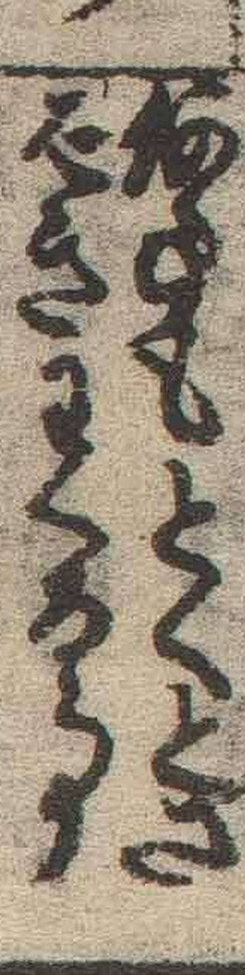はきわくる事
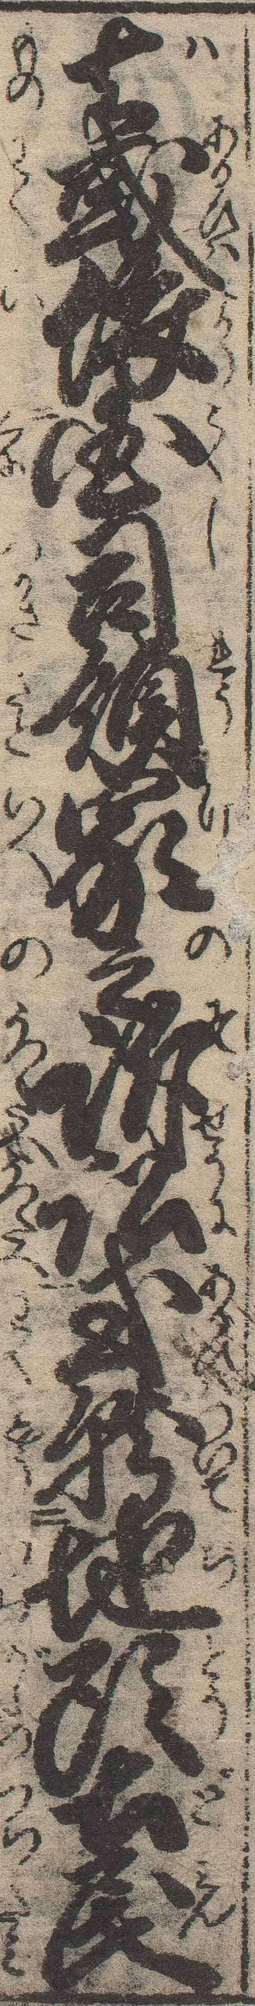者或依国司領家之訴訟或就地頭土民
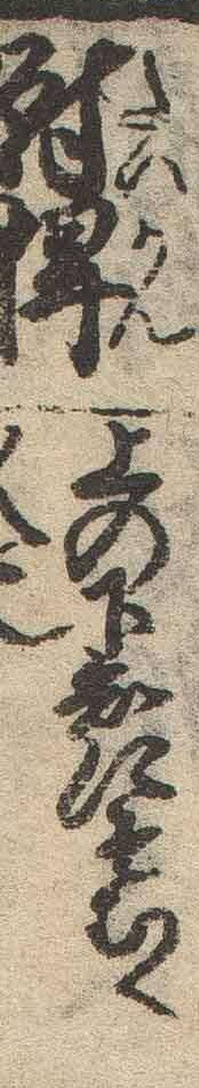対捍上の下知にそむく
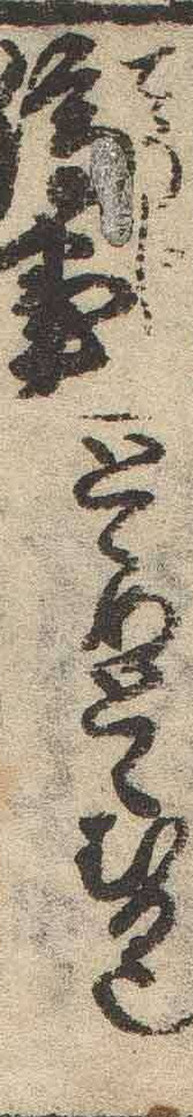停事とゝめとゝむる也
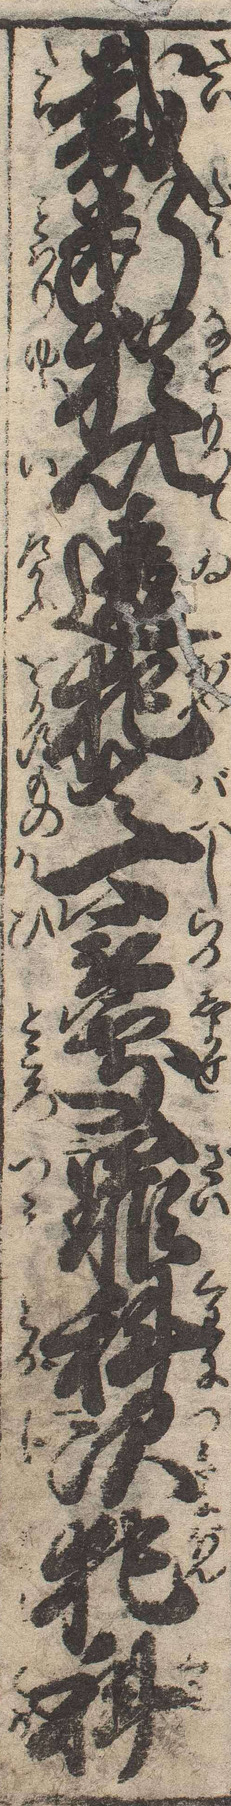裁断猶以違犯者可被處罪科次犯科
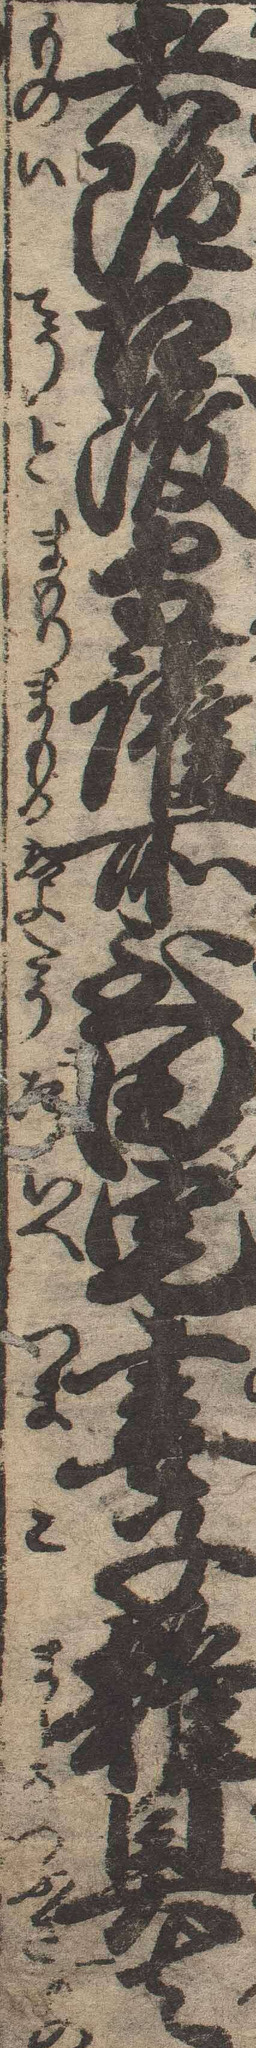者雖召渡守護所至田宅妻子雑具者

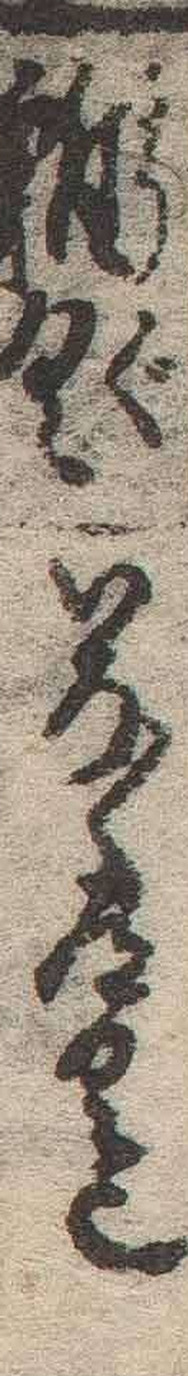雑具いろ〳〵道具也
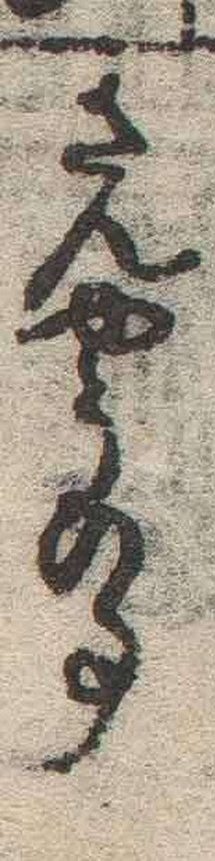結解さんやうの事
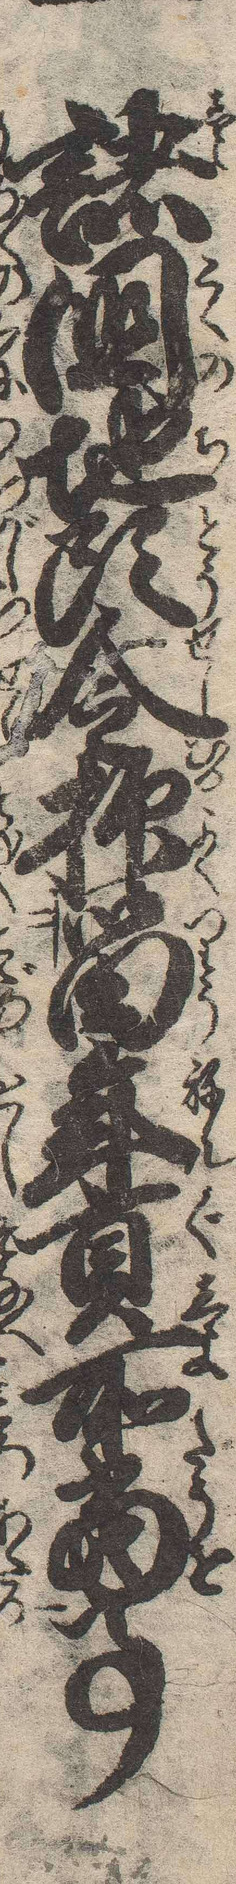一諸国地頭令抑-留年貢所當事
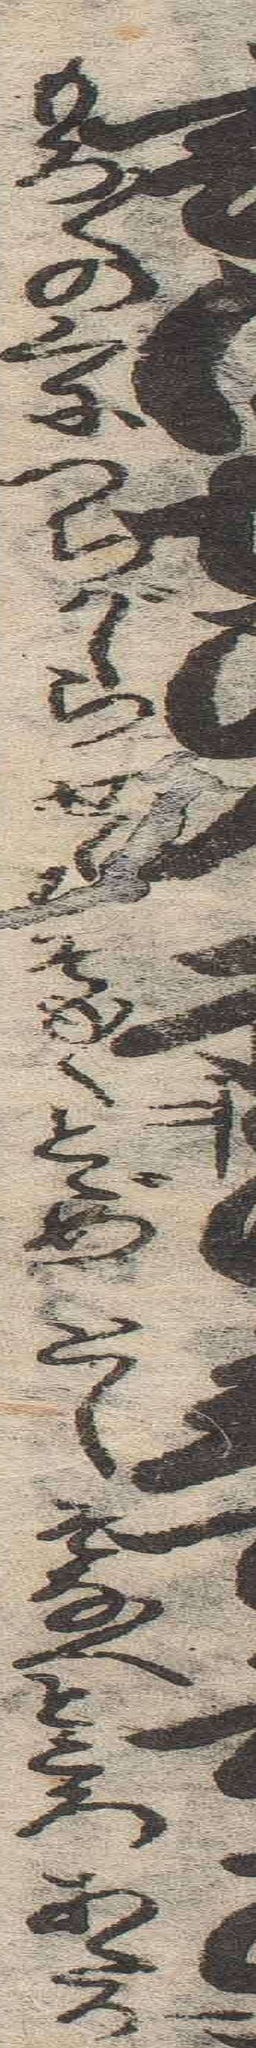もろ〳〵のくにつちがしらせしむそも〳〵とゞめとしそなへところあたり
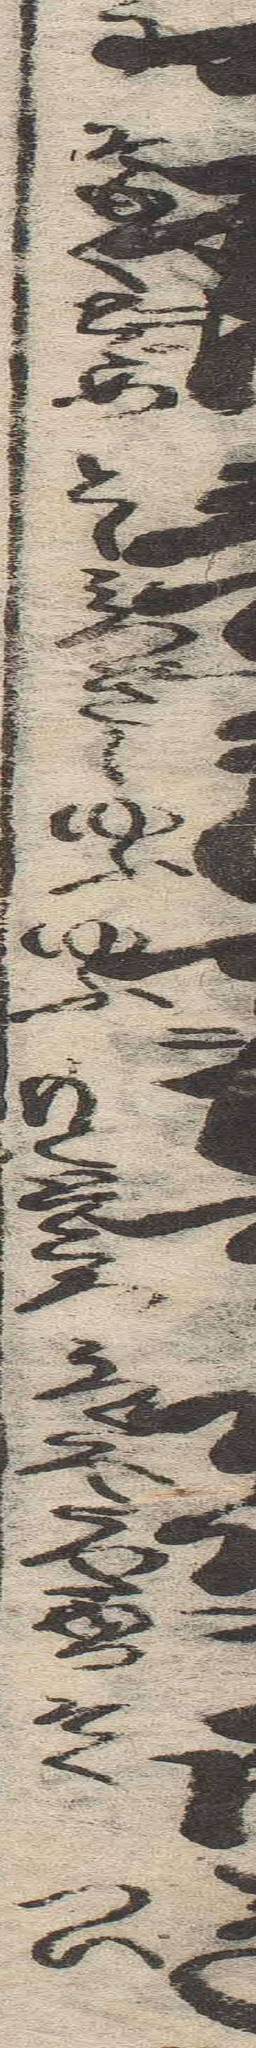うそも〳〵とゞめとしみつぎしゆふゆふもとところうつたへたつたゆるそくつい
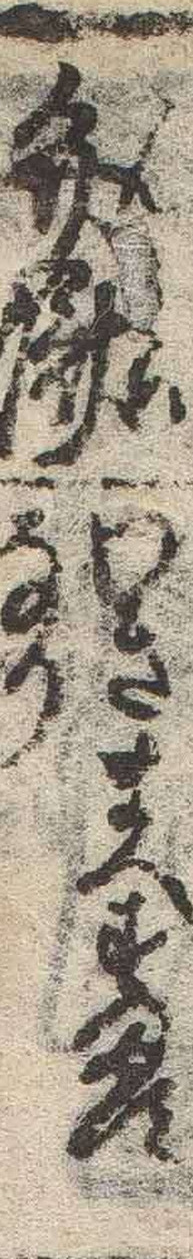弁済わきまへすます
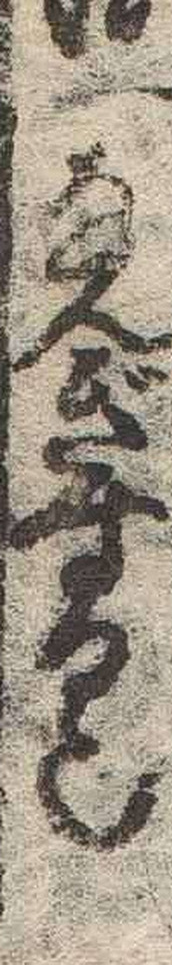なんぎする也
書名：御成敗式目絵抄
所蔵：東京学芸大学附属図書館 国文学研究資料館
